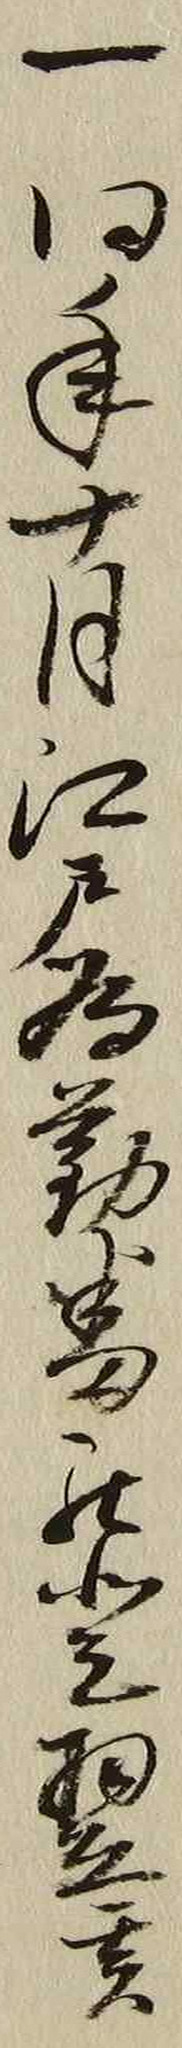一同年十月江戸為勤番罷登翌亥
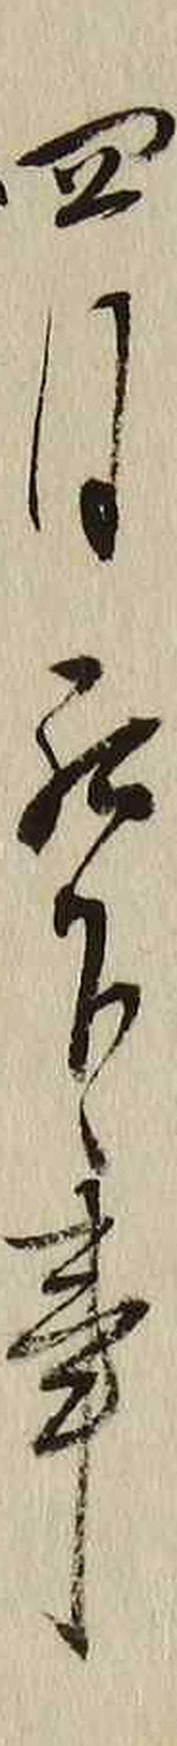四月罷下候事
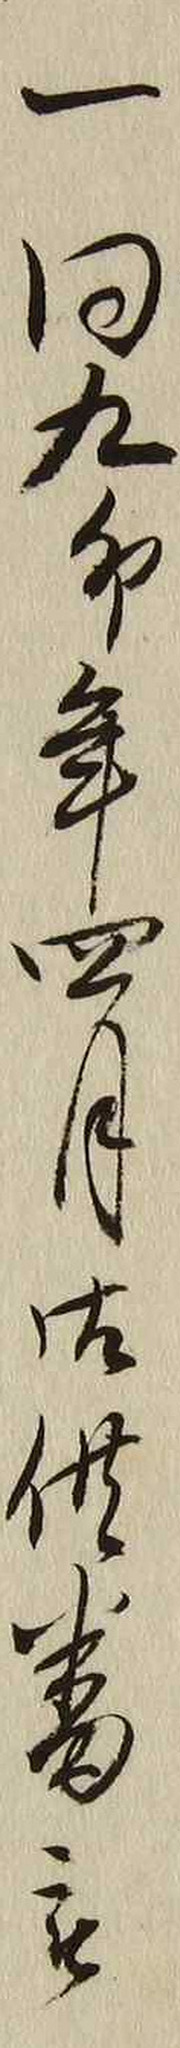一同九卯年四月御供番被
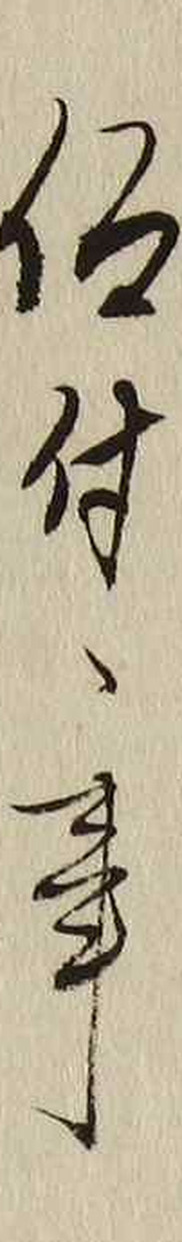仰付候事
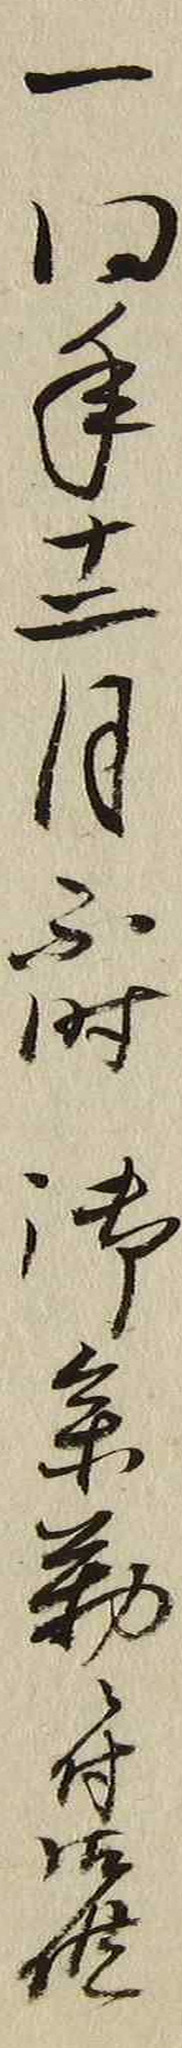一同年十二月不時御参勤ニ付御供
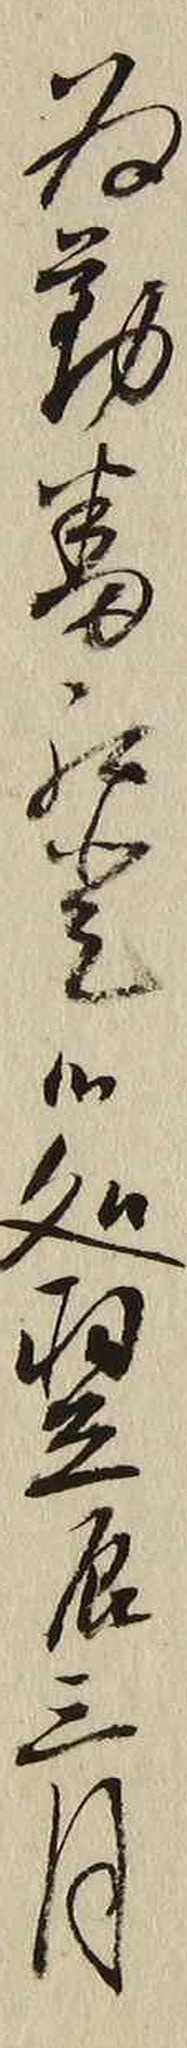為勤番罷登候処翌辰三月
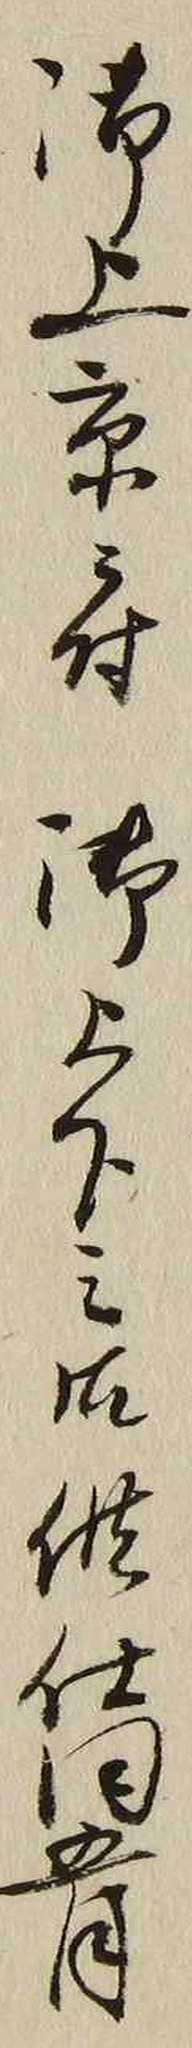御上京ニ付御上下之御供仕同五月
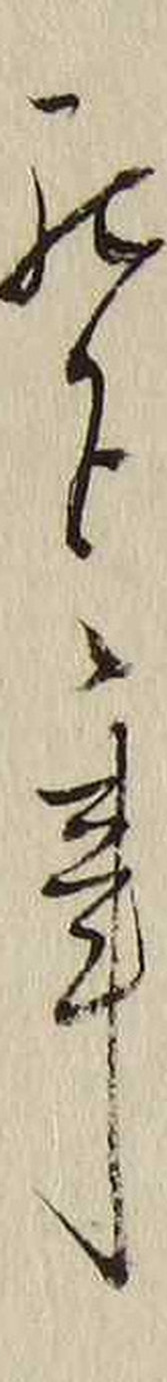罷下候事
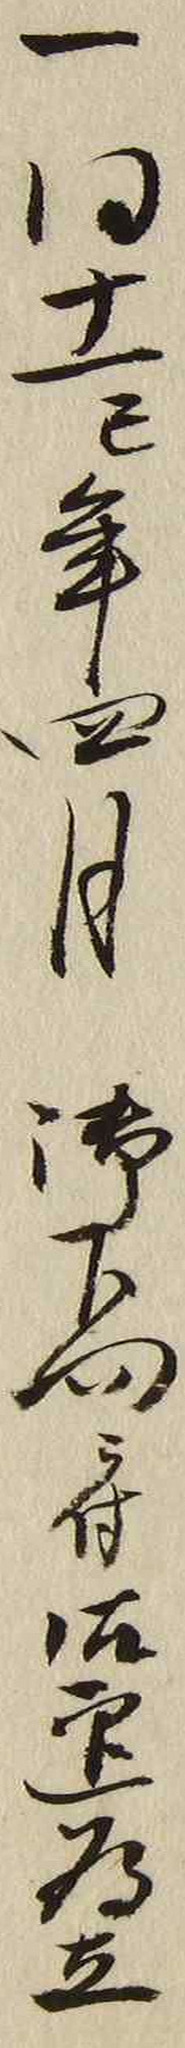一同十一巳年四月御下向ニ付御迎為立

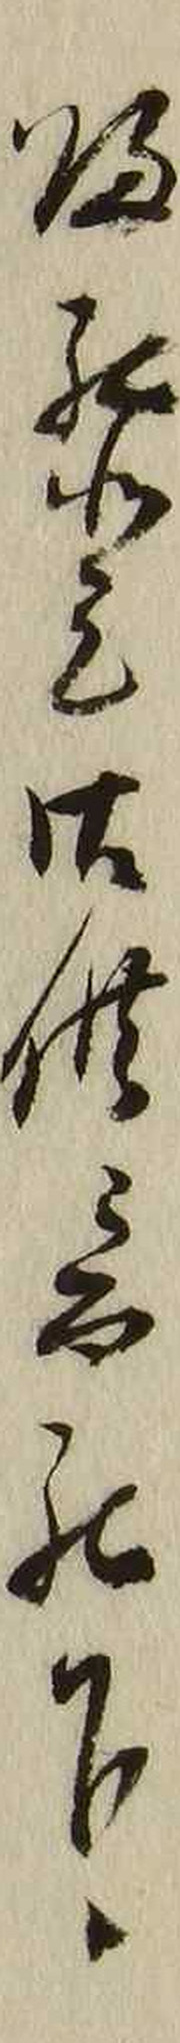帰罷登御供ニ而罷下候
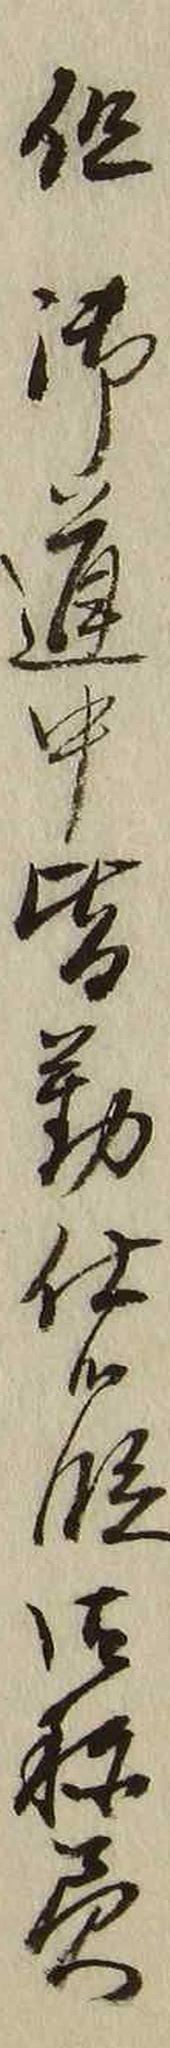但御道中皆勤仕候段御称美
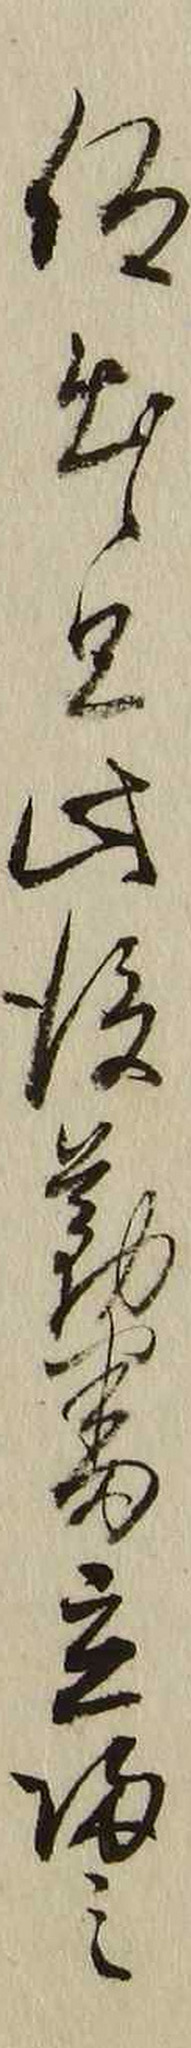被仰出候且此後勤番立帰之
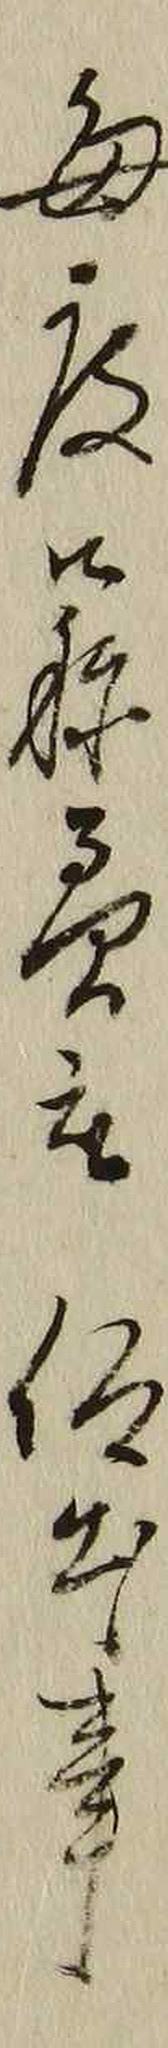毎度御称美被仰出候事
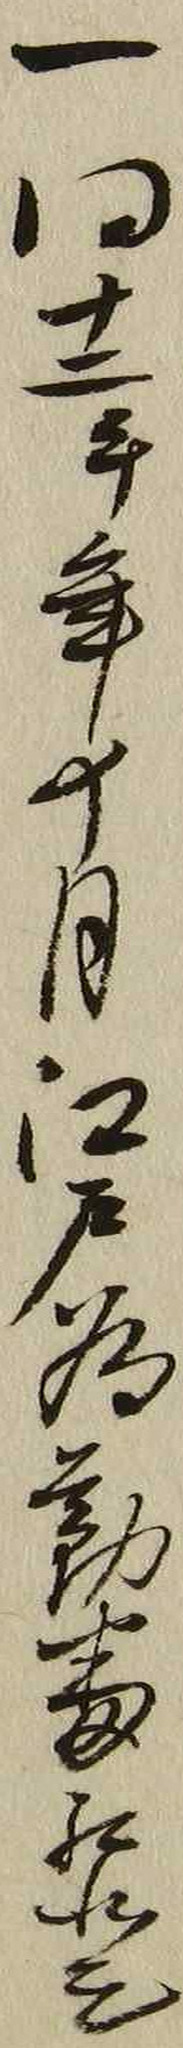一同十二午年十月江戸為勤番罷登
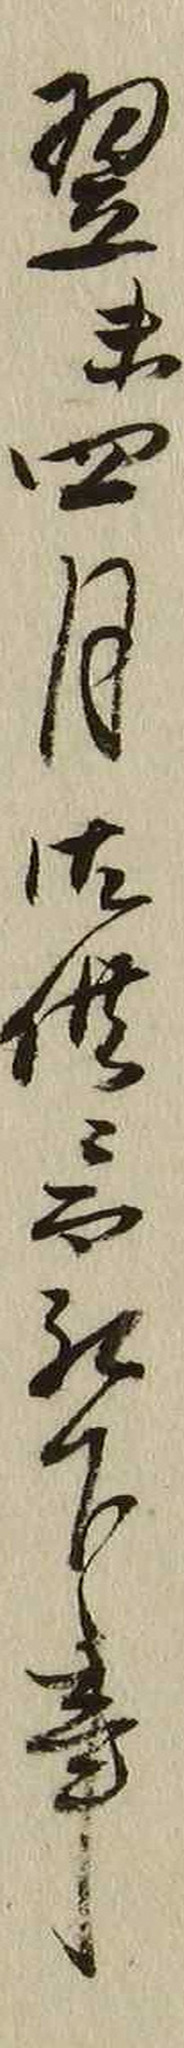翌未四月御供ニ而罷下候事
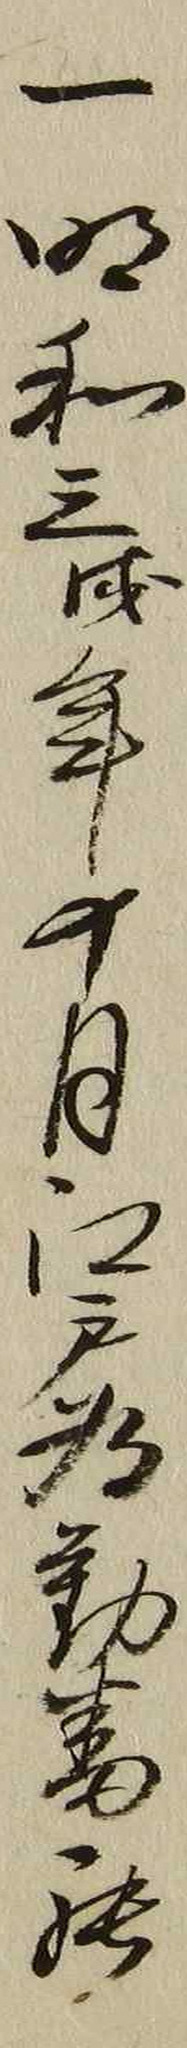一明和三戌年十月江戸為勤番罷
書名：諸士系譜　巻之352　す之部2
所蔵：会津若松市立会津図書館
